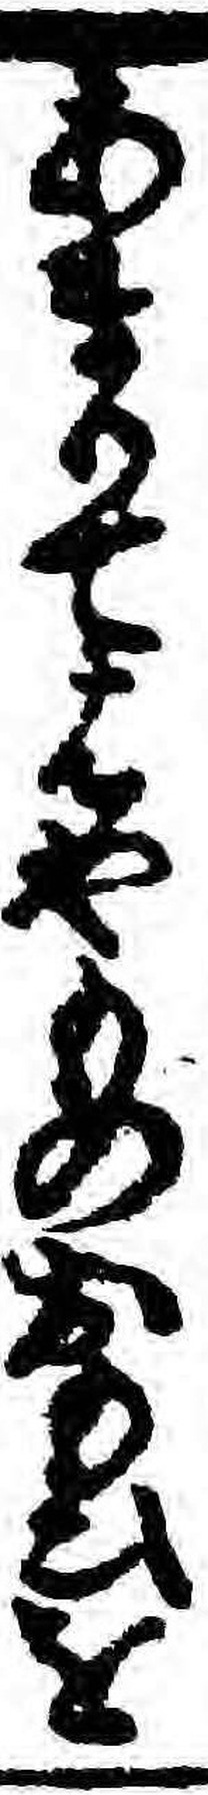あまりてはやものおもひを
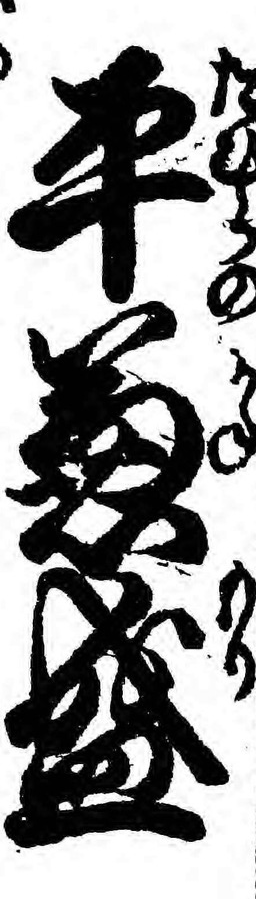平兼盛
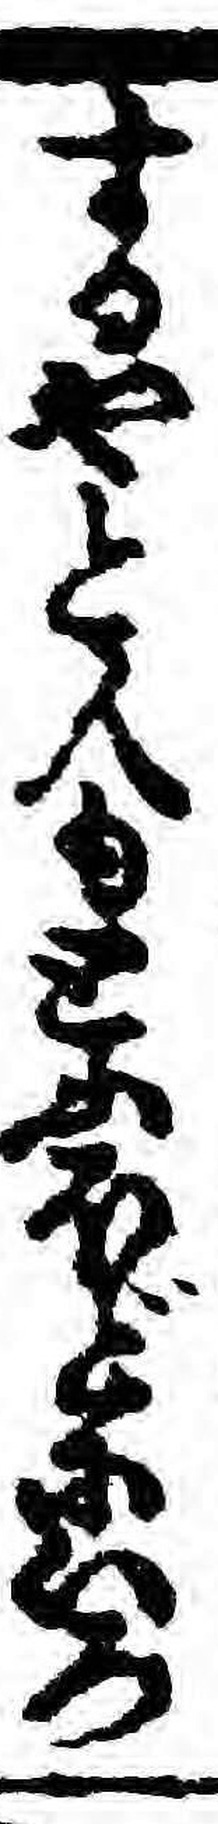するやと人もとふほどにいろ
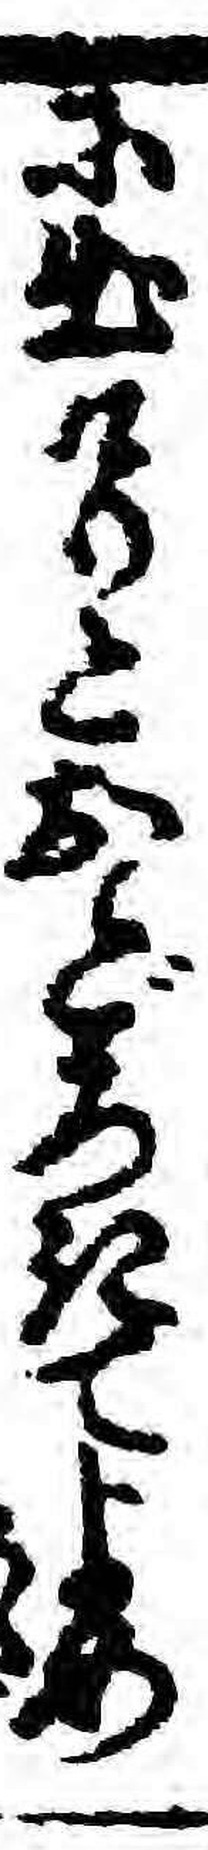に出けりとおどろきてよめ
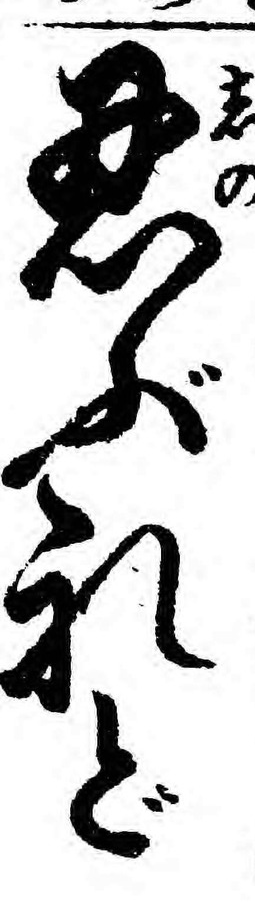忍ぶれど
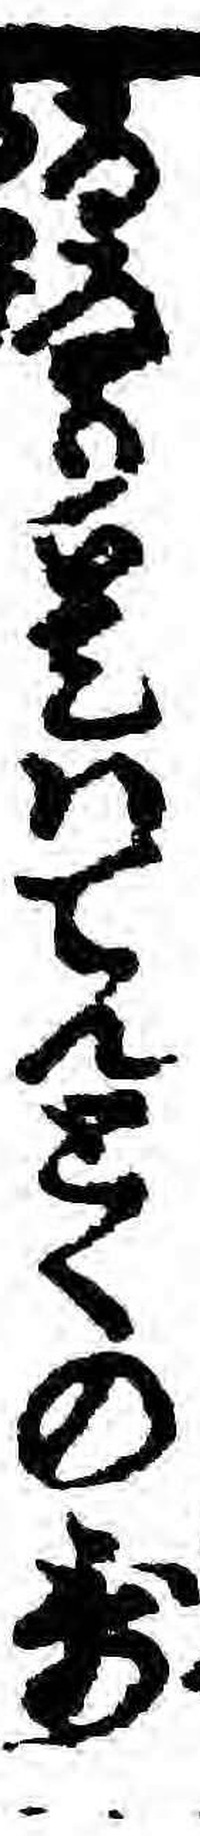るなり是はてんとくの哥
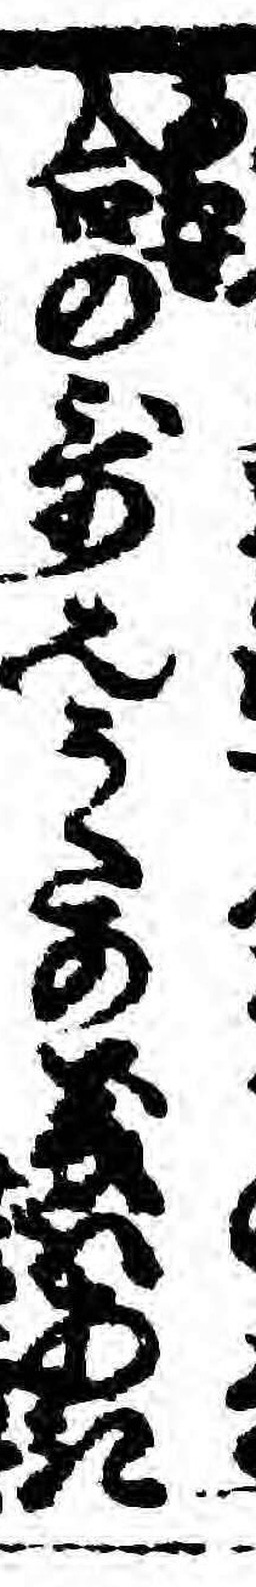合の哥也うたの義はあき
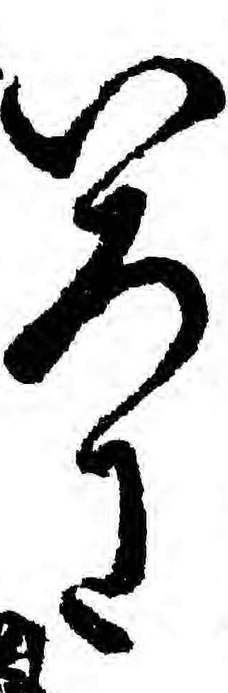いろに
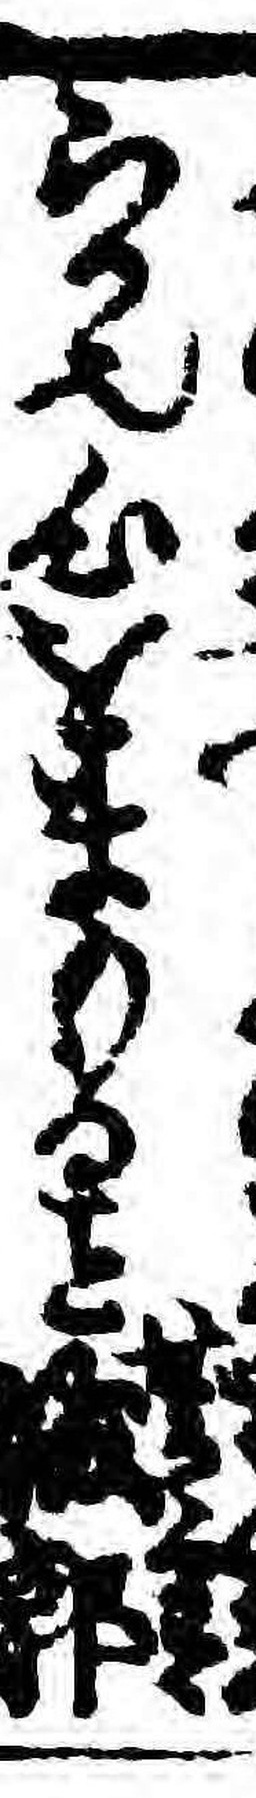らか也心をまもること城郭
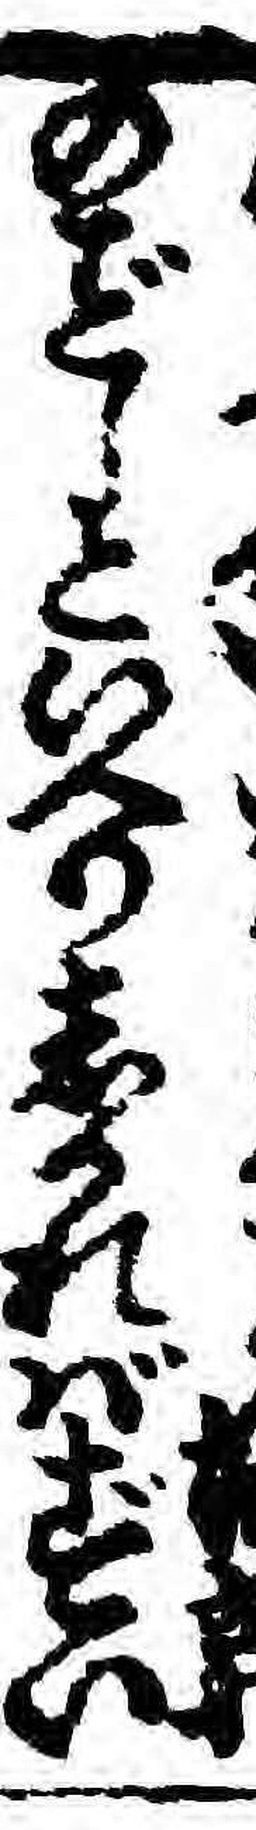のごとしといへりしかればずい
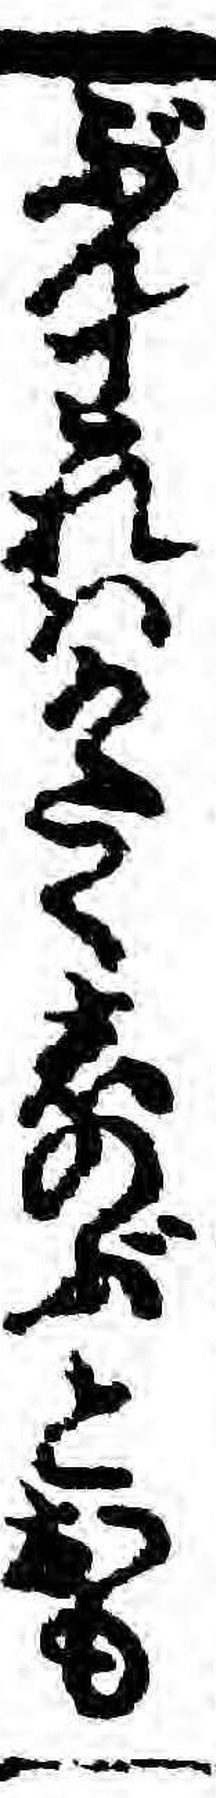ぶんわれはかたくしのぶとおも
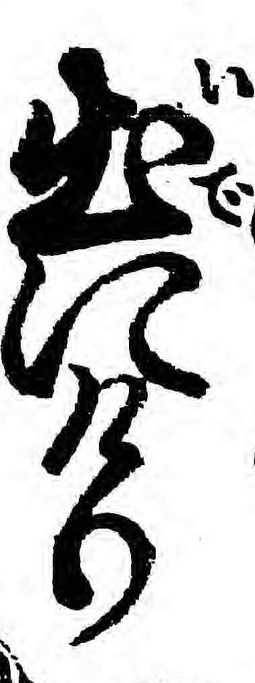出にけり
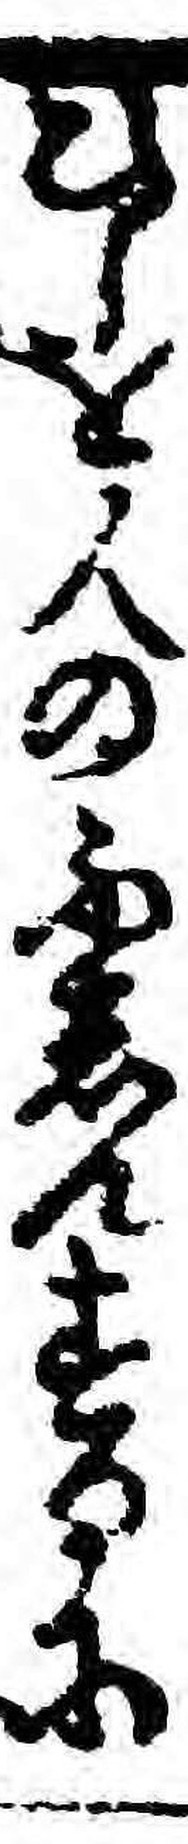ひしを人のふしんするに
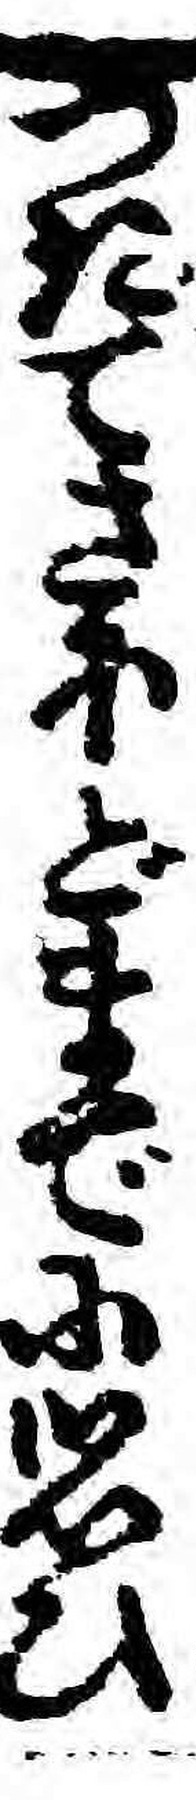つきてさほどまでに思ひ
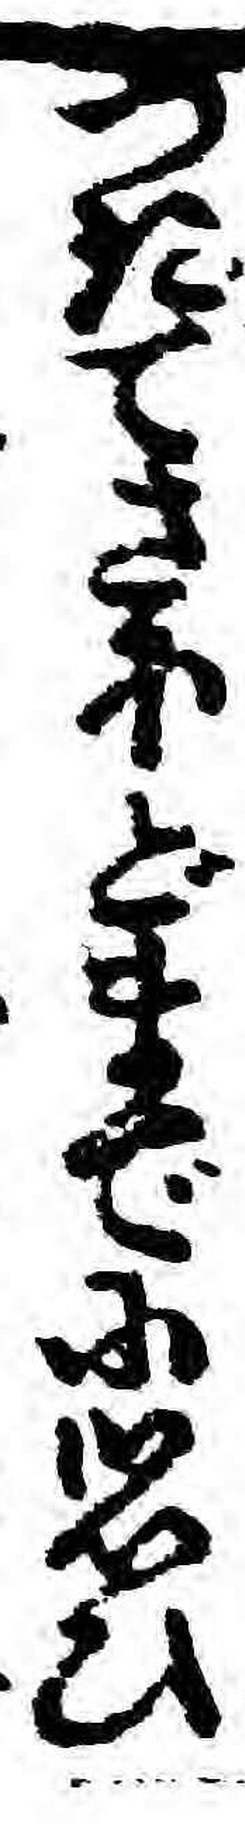つきてさほどまでに思ひ
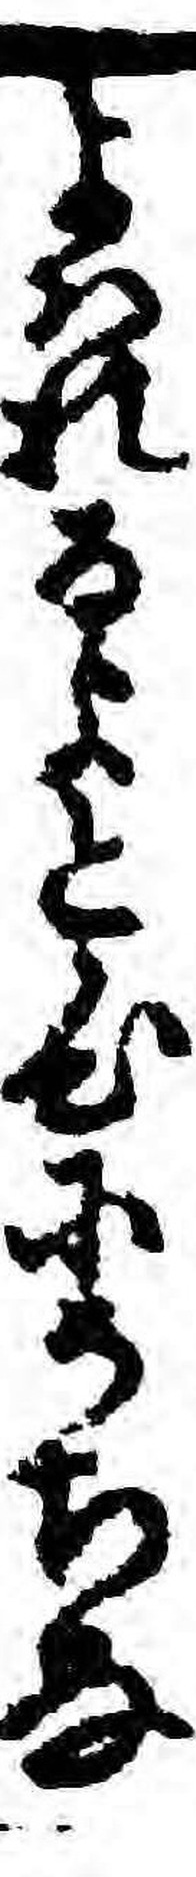よはれるよと心にうちな
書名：頭書和歌注譯／壽賀多百人一首小倉錦
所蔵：国文学研究資料館
